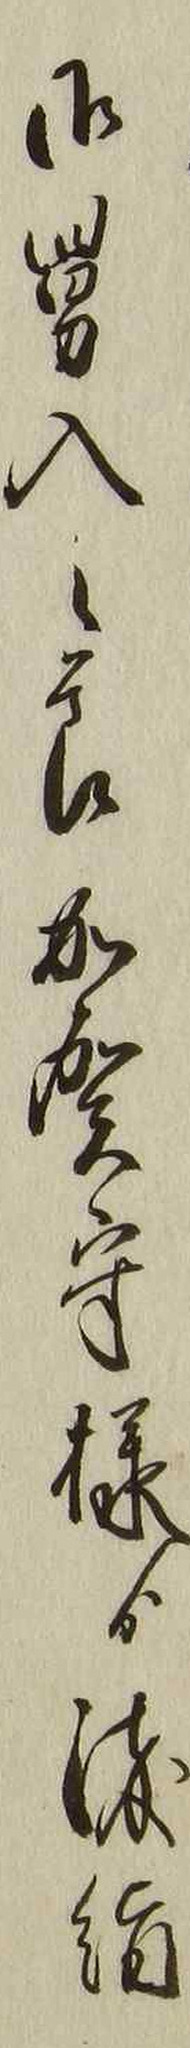御舅入之節加賀守様ゟ染絹
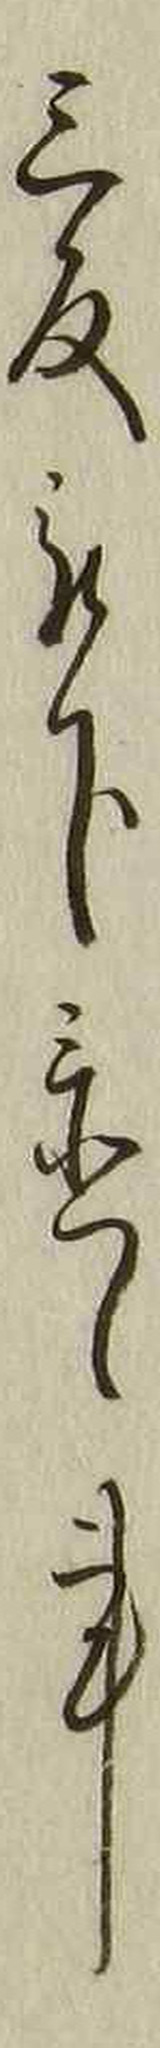三反被下置候事
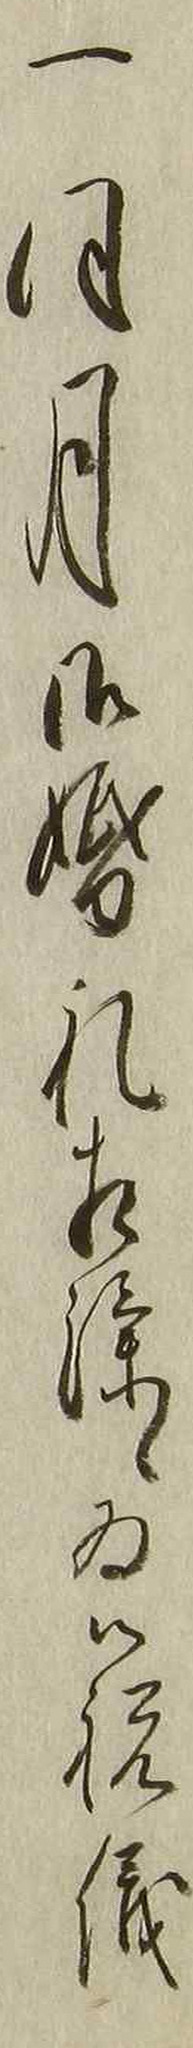一同月御婚礼相済候為御祝儀
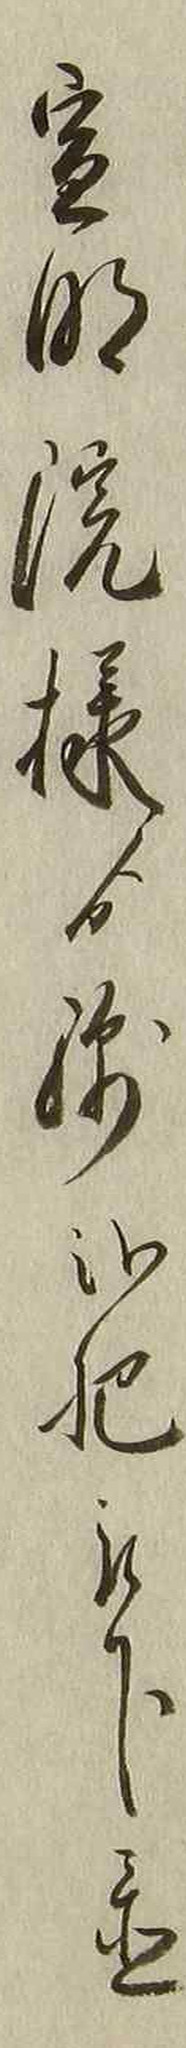宣明院様ゟ綿弐把被下置
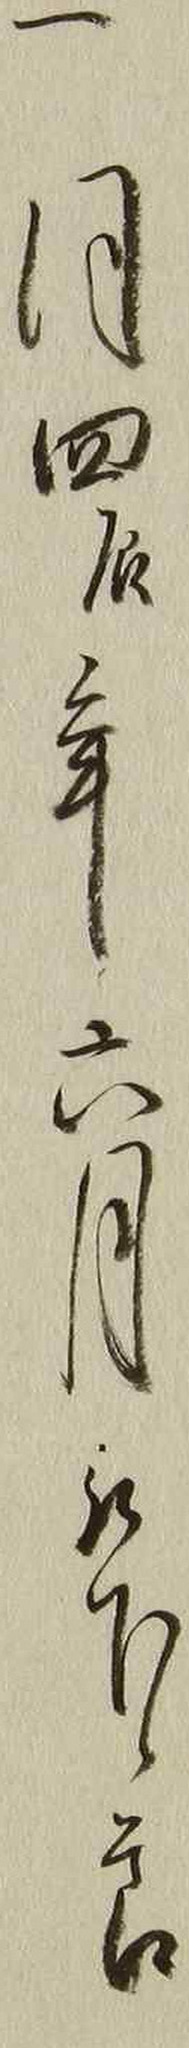一同四辰年六月被下候節
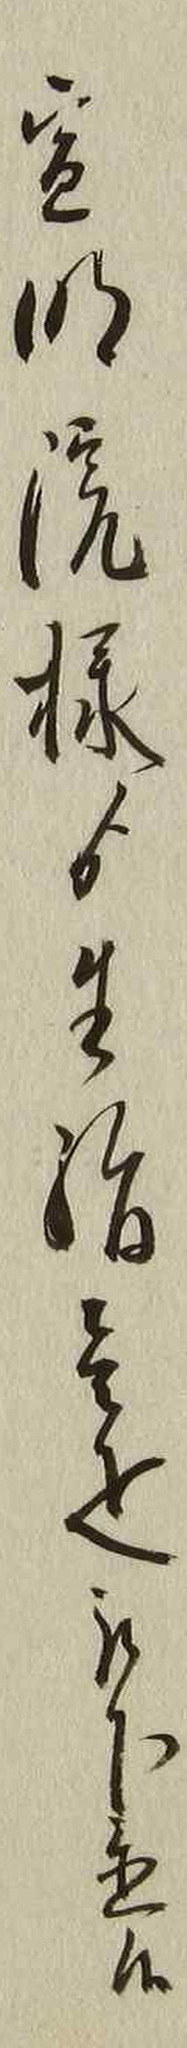宣明院様ゟ生絹壱疋被下置候
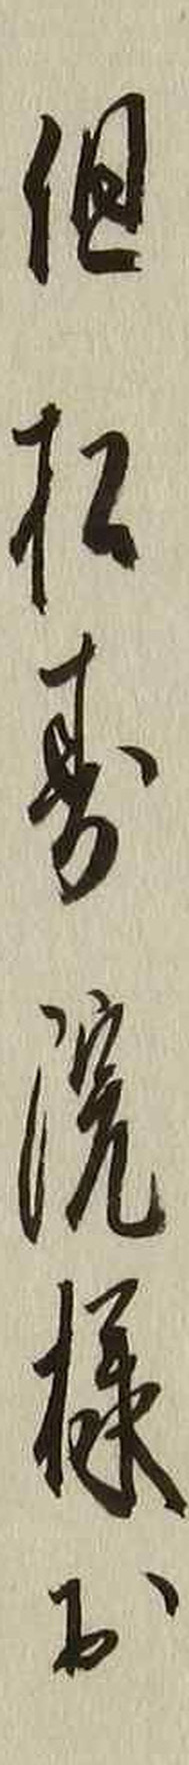但松寿院様於
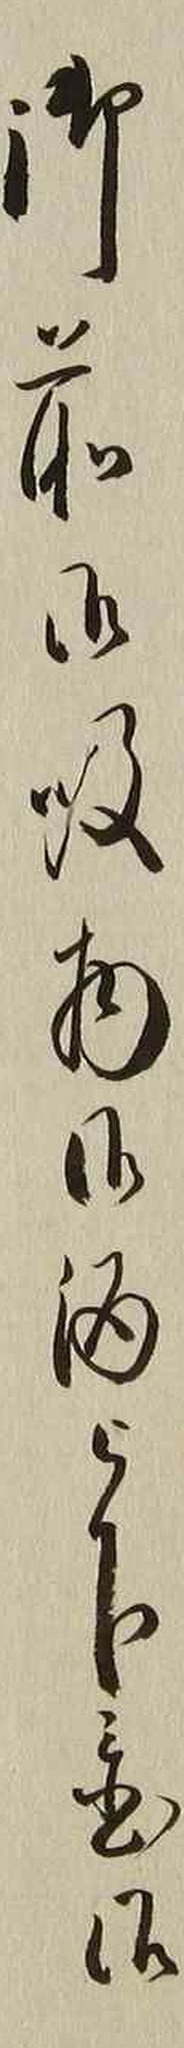御前御吸物御酒被下置候
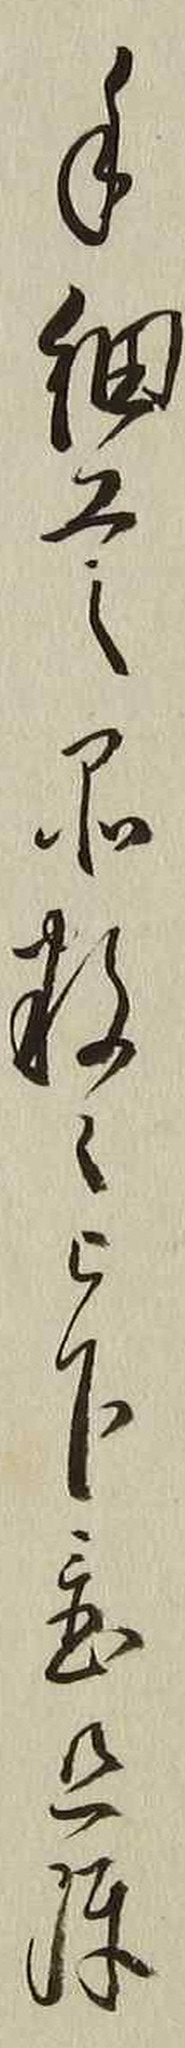手細工之品数々被下置且陣
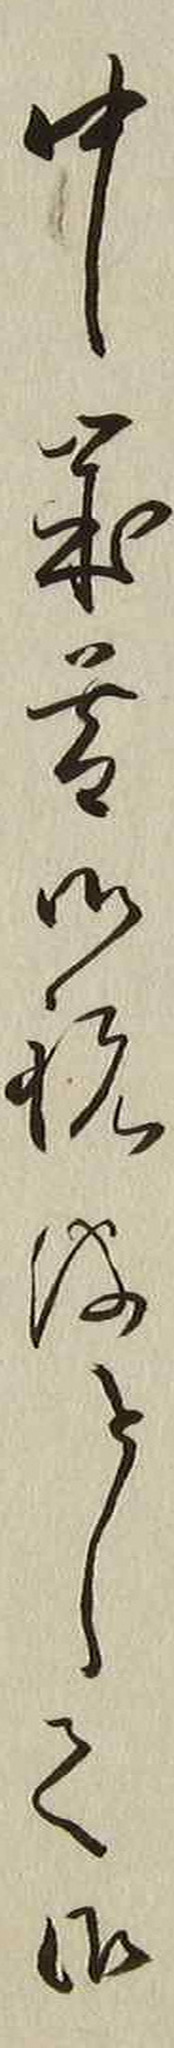中歳暮御祝儀として御
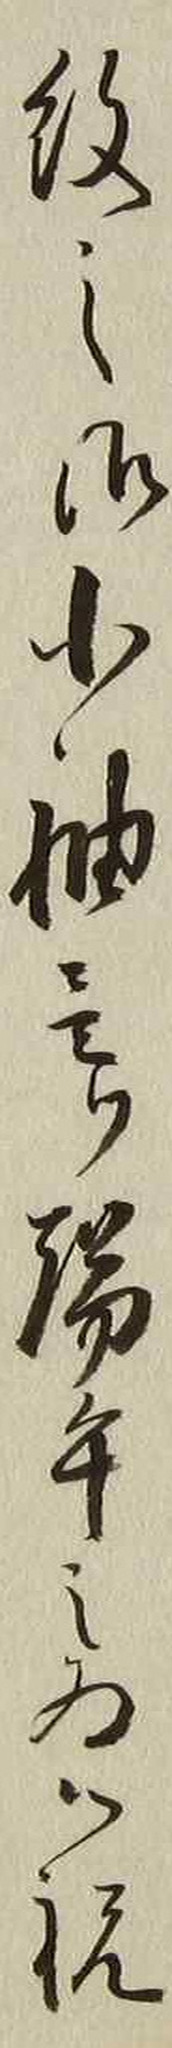紋之御小袖壱ツ端午之為御祝
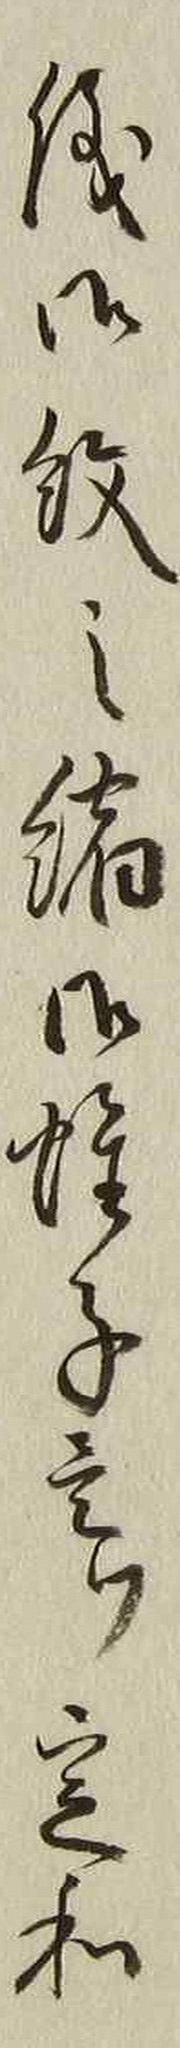儀御紋之縮御帷子壱ツ定和
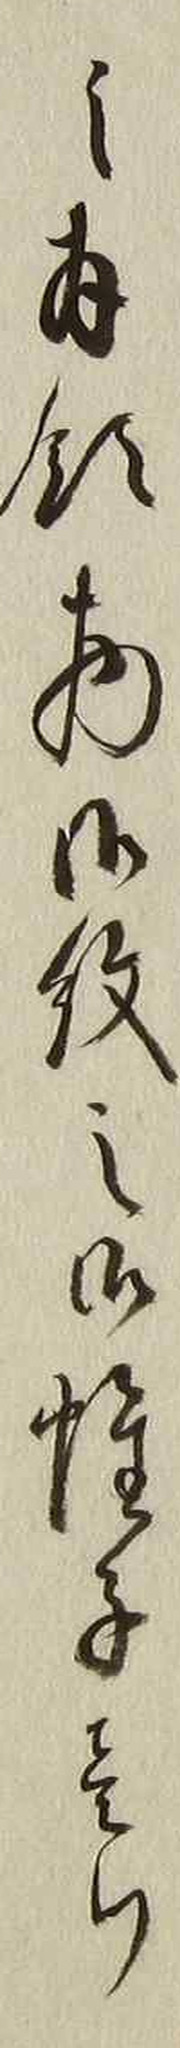之拝領物御紋之御帷子壱ツ
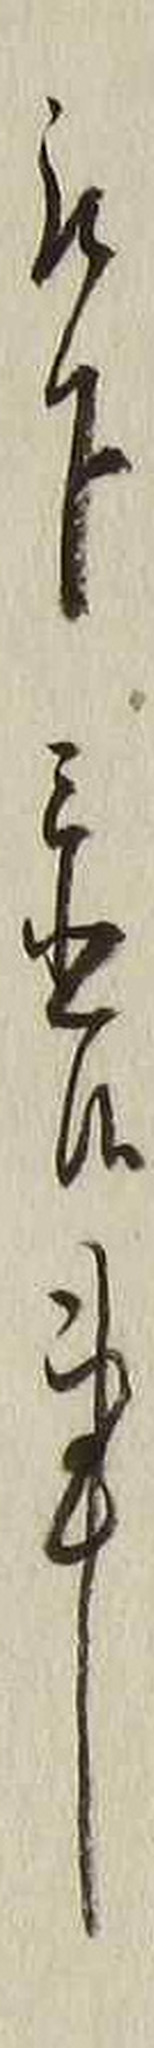被下置候事
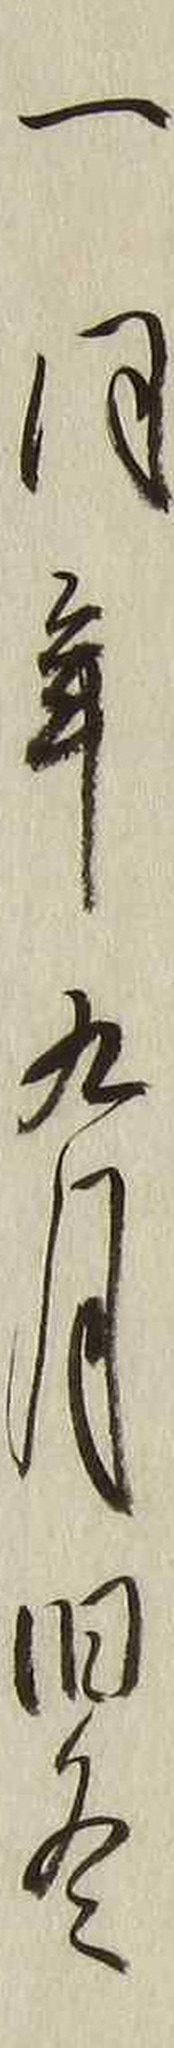一同年九月旧冬
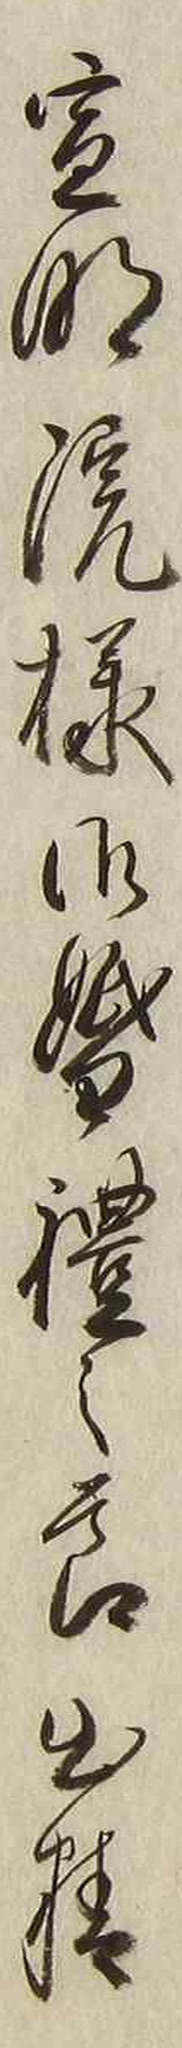宣明院様御婚礼之節出精
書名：諸士系譜　巻之18　い之部18
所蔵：会津若松市立会津図書館
